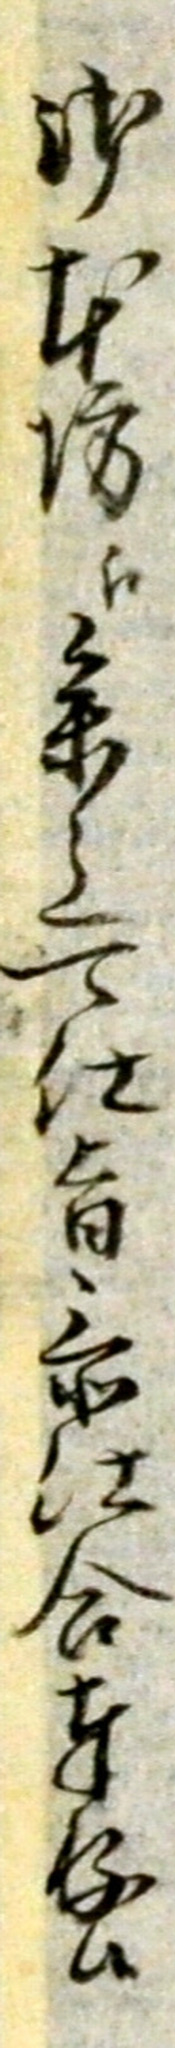御本坊江参上可仕旨忝仕合奉存候
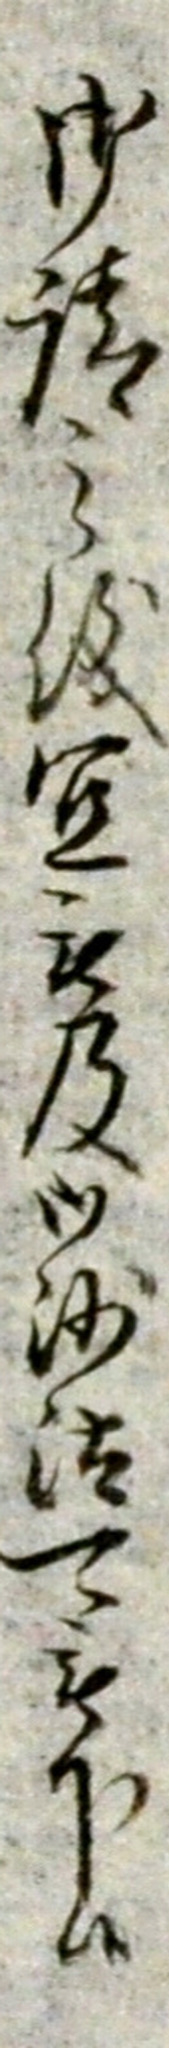御請之儀宜被及御沙汰可被下候
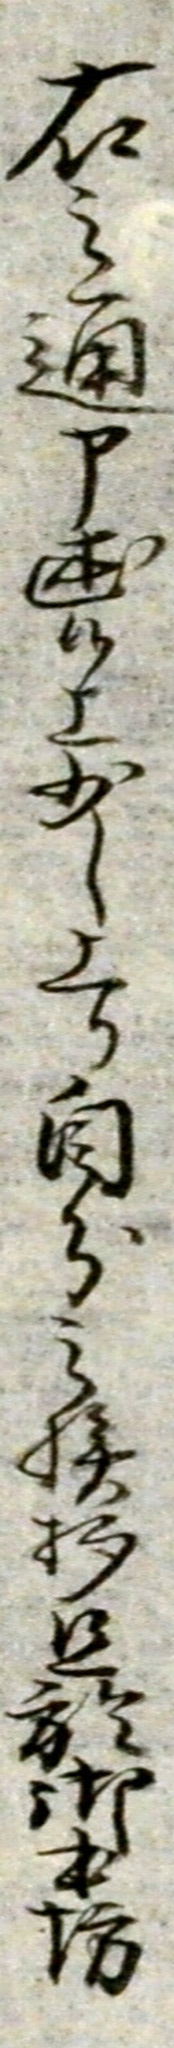右之通申述候上少し上り自分之挨拶且於御本坊
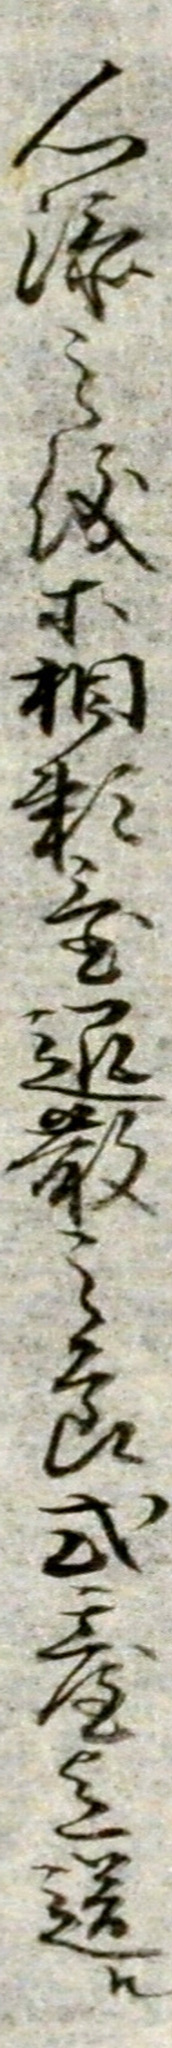心添之儀等相頼置退散之節式台迄送ル
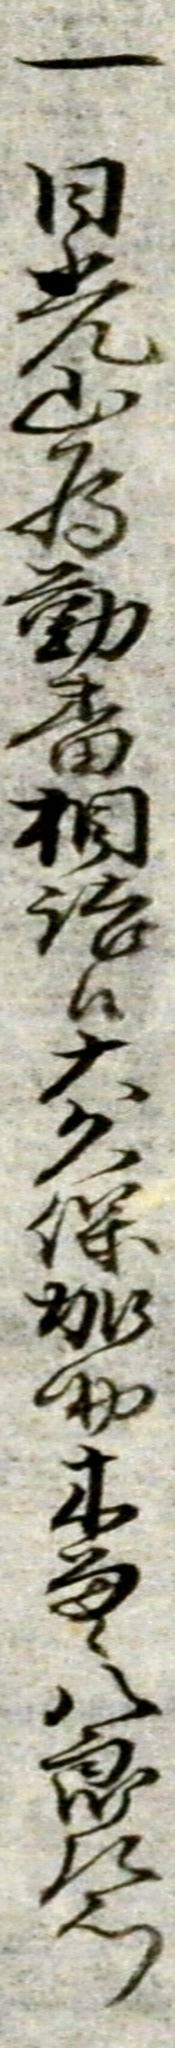一日光山為勤番相詰候大久保加助木曽八郎左衛門
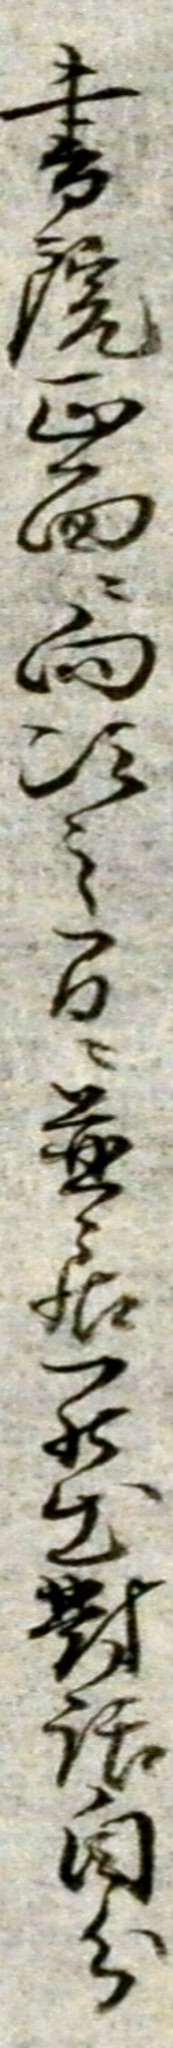書院正面ニ向次之間ニ並居罷出対話自分
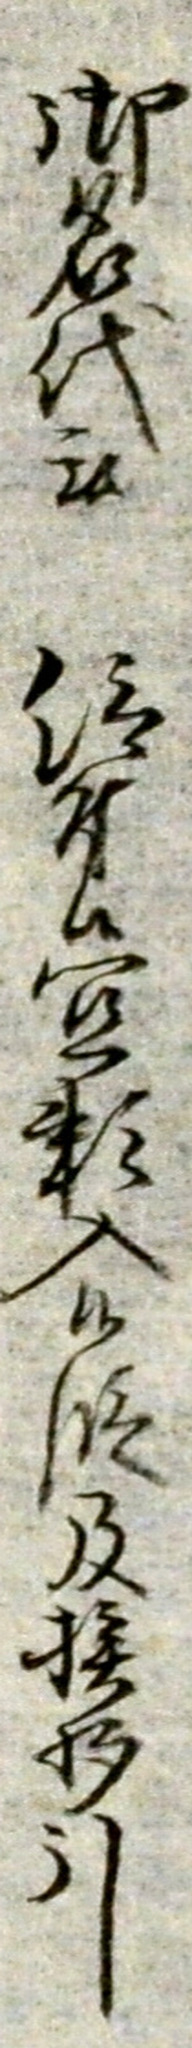御名代被仰付候宜頼入候段及挨拶引
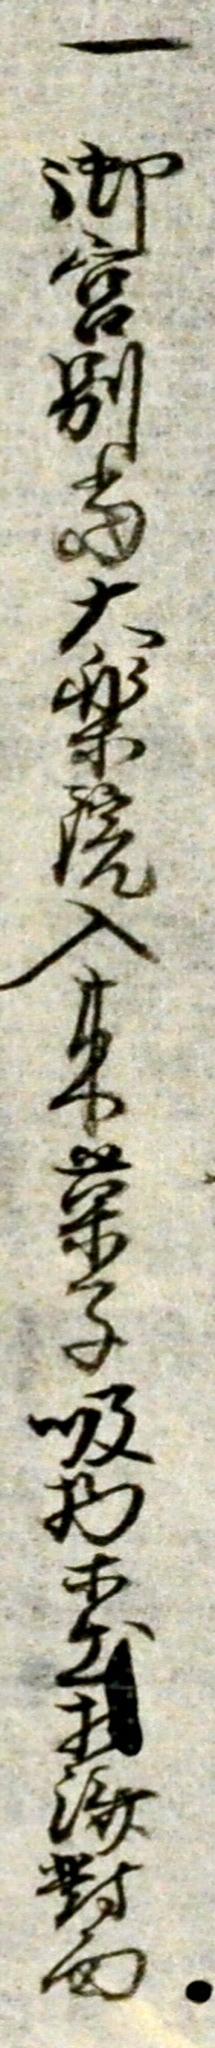一御宮別当大楽院入来菓子吸物等出相済対面
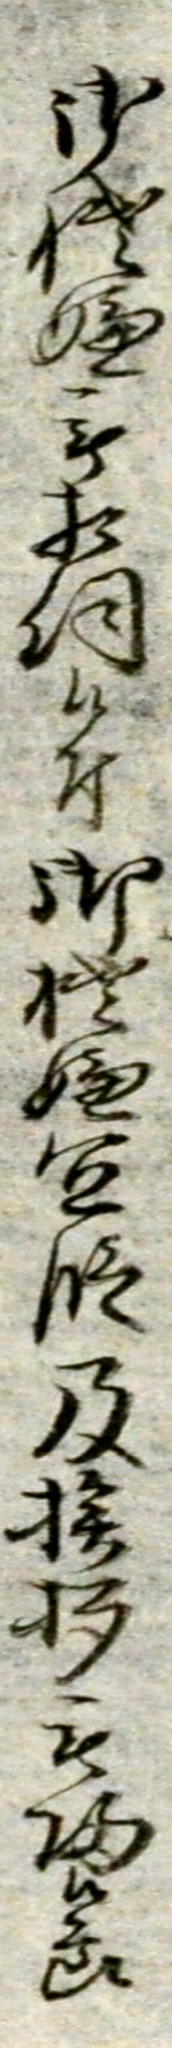御機嫌被相伺候付御機嫌宜段及挨拶被帰候節
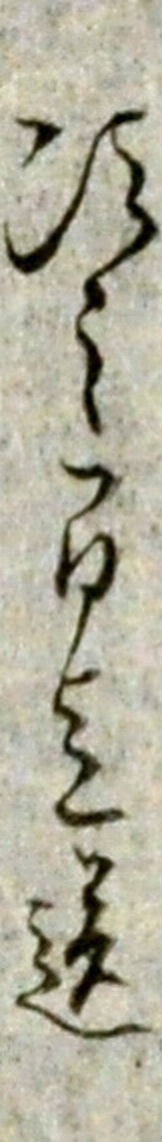次之間迄送
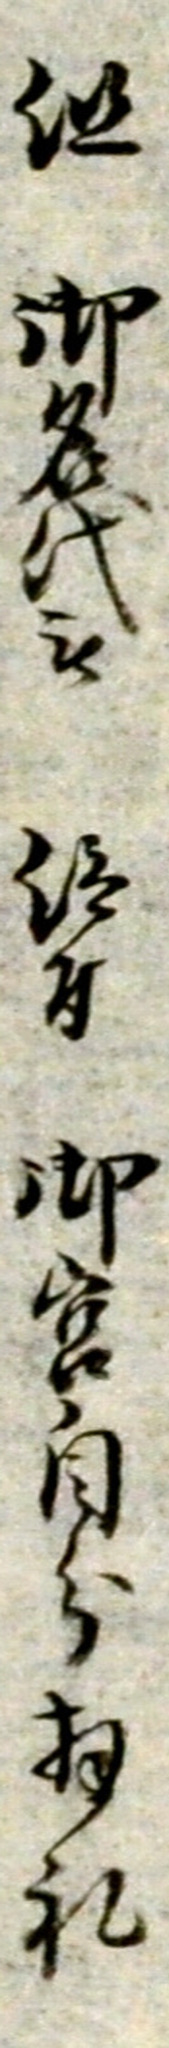但御名代被仰付御宮自分拝礼
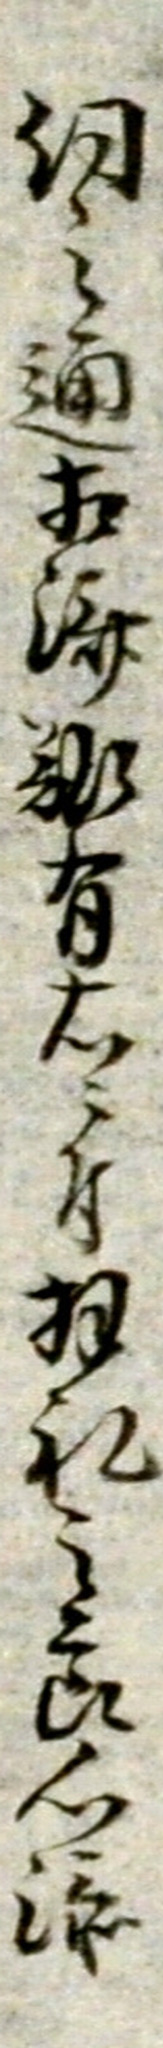伺之通相済難有右ニ付拝礼之節心添
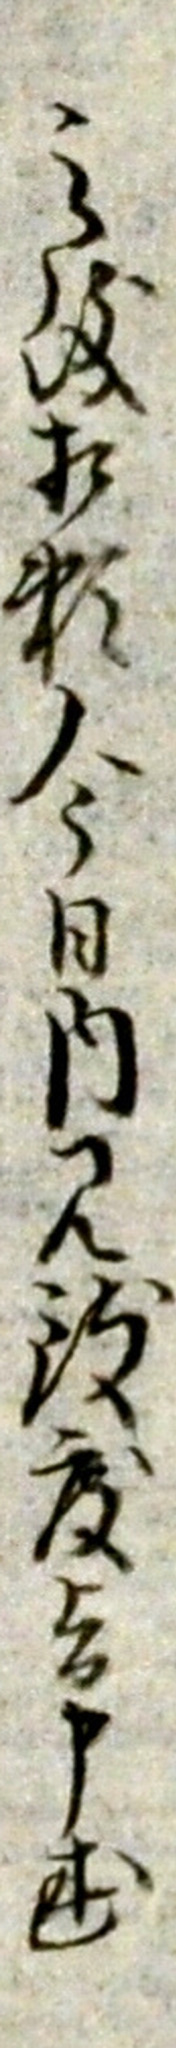之儀相頼今日内見致度旨申述
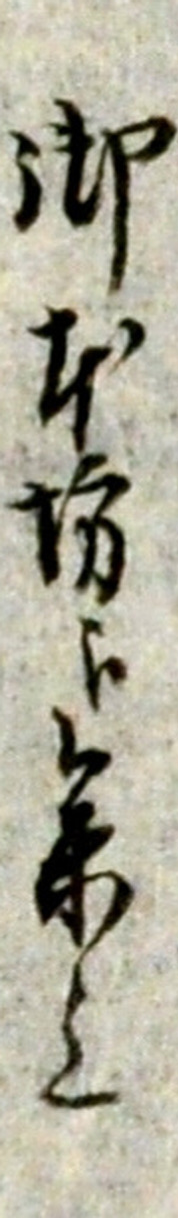御本坊江参上
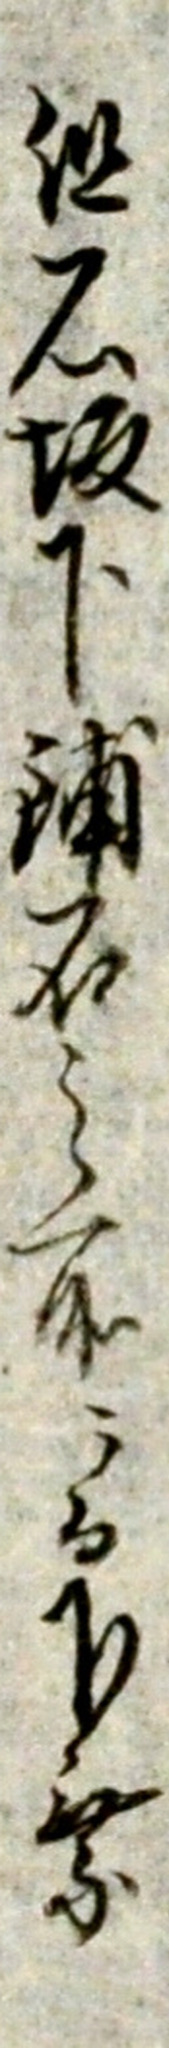但石坂下鋪石之所ニ而下乗
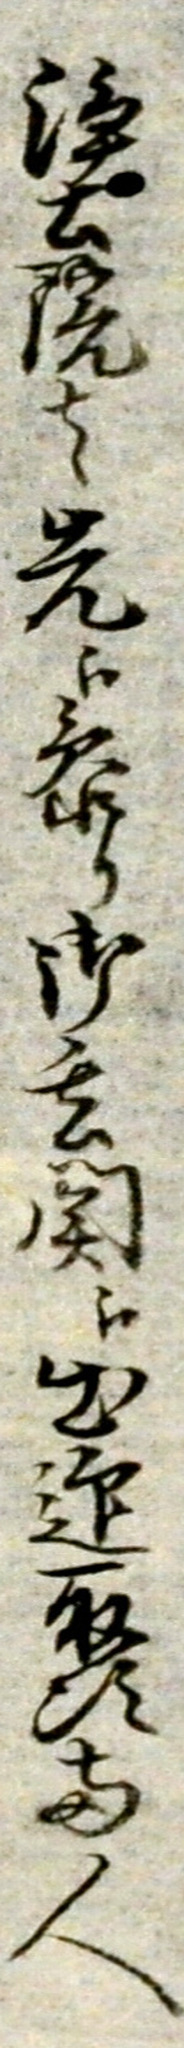浄土院者先江参り御玄関江出迎取次両人
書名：日光御名代相勤候節ノ留
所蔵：伊那市立高遠町図書館・合同会社AMANE
